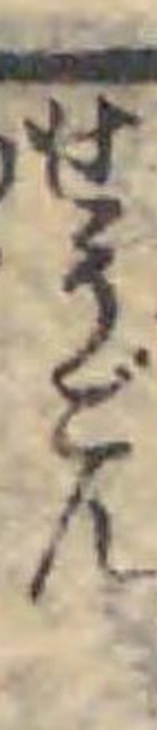せうごん
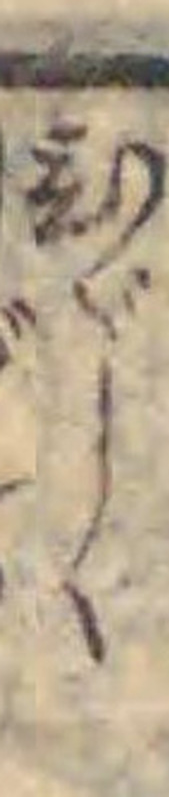ひゞしく
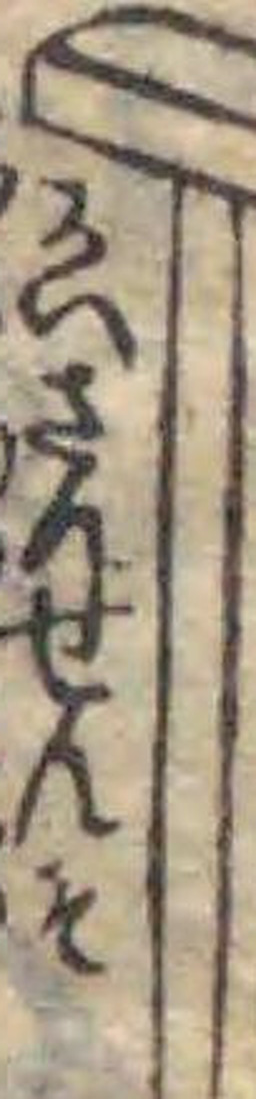かいさんせんそ
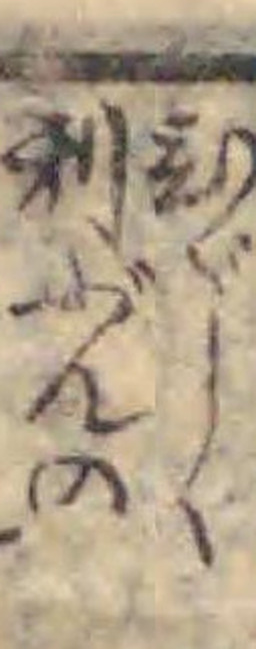利ぶんの
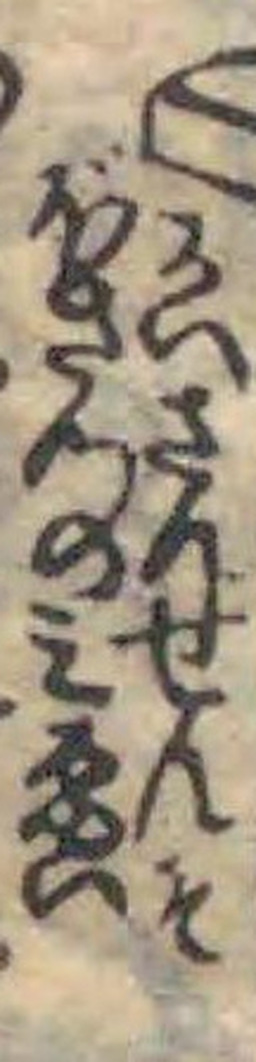ぼさつのみゑは
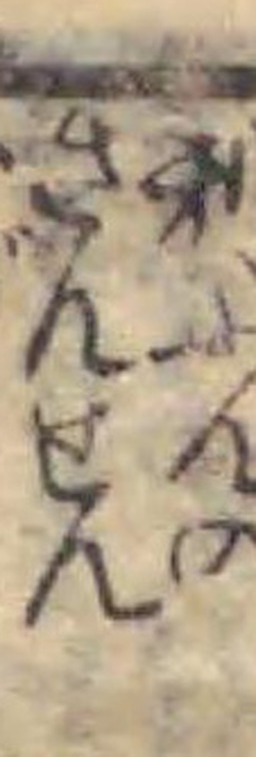きんせん
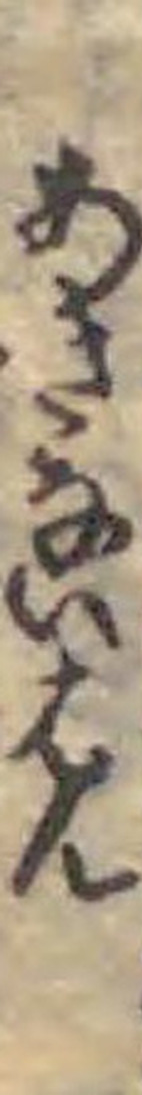あきないはん
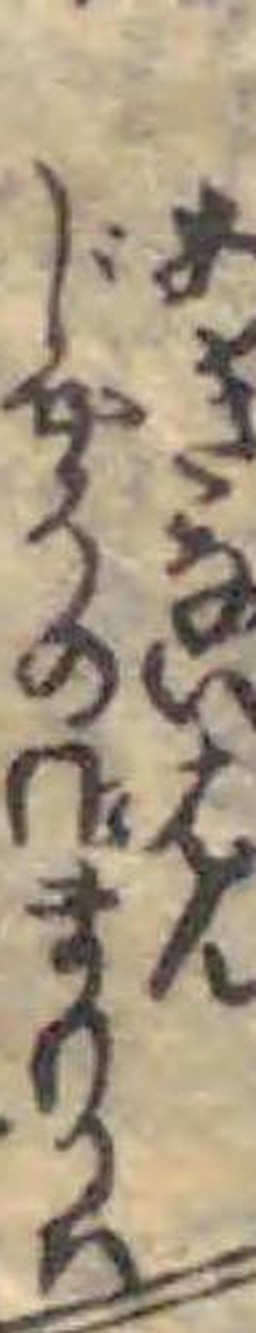じやうの御まもりは
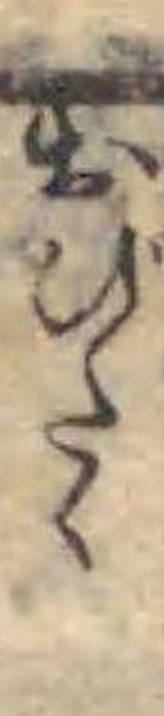おびたゝ
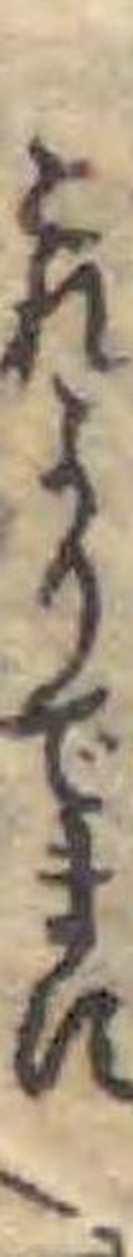これよりでます
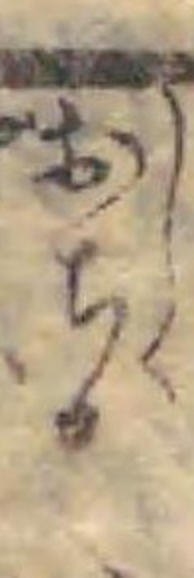おちる
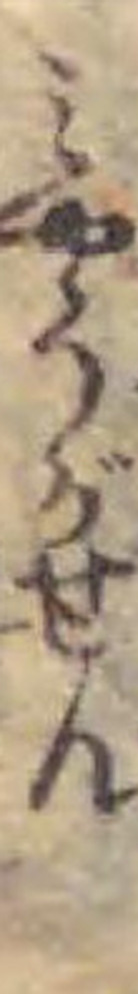みやうがせん
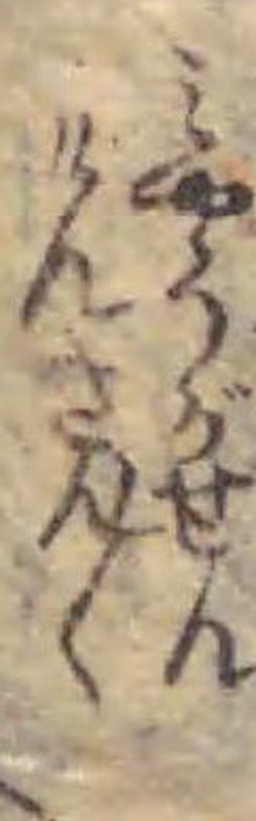げんさん〳〵
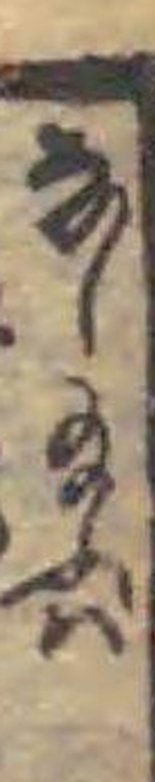なし給ふは
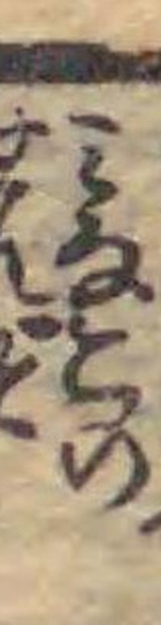みなこの
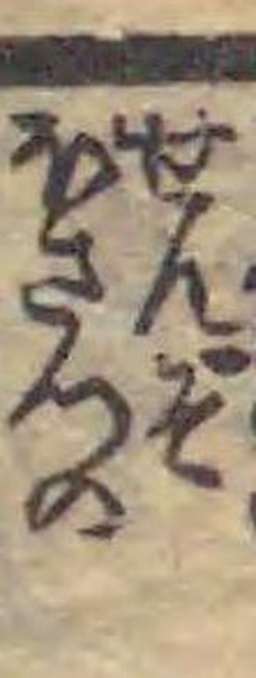ほさつの
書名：身体開帳略縁起 : 3巻
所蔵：国立国会図書館 National Diet Library, JAPAN
